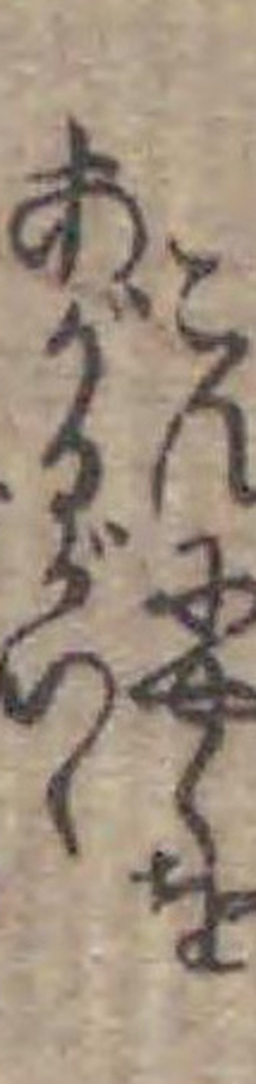あがるがいゝ
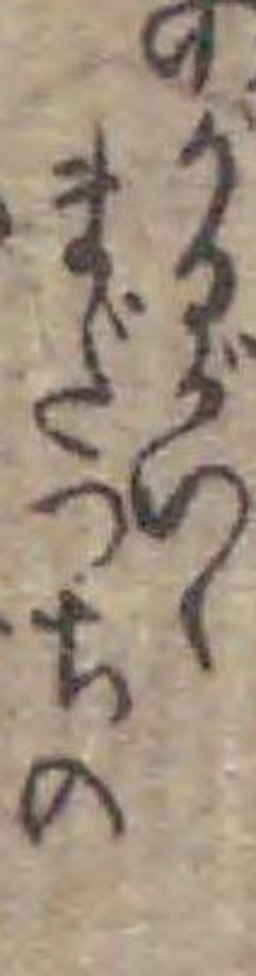まだつちの
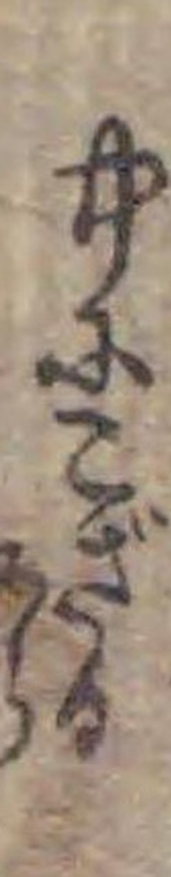中にこざる
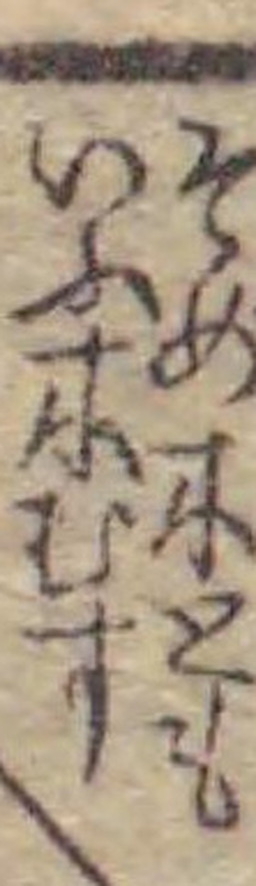いふ木むす
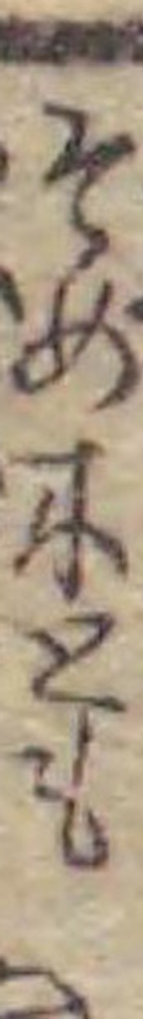そめ木とも
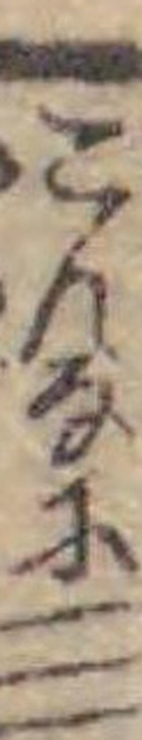こんなに
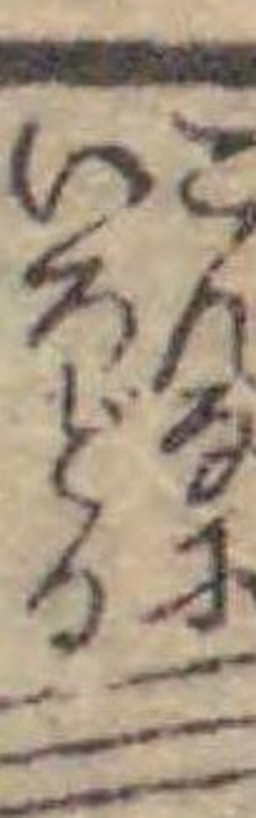いろどる
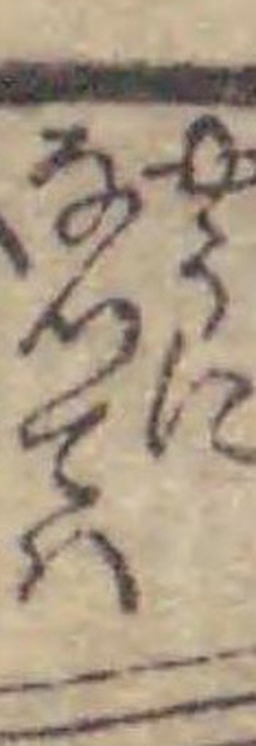なつては
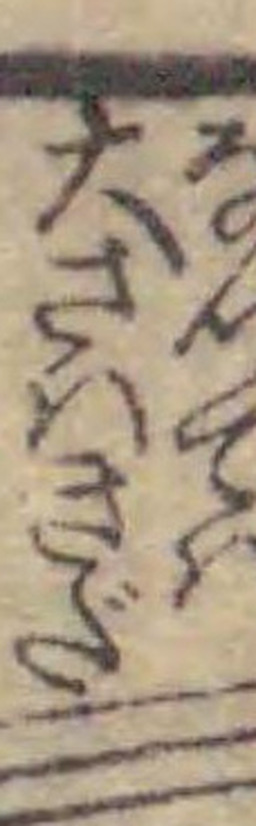大さはきだ

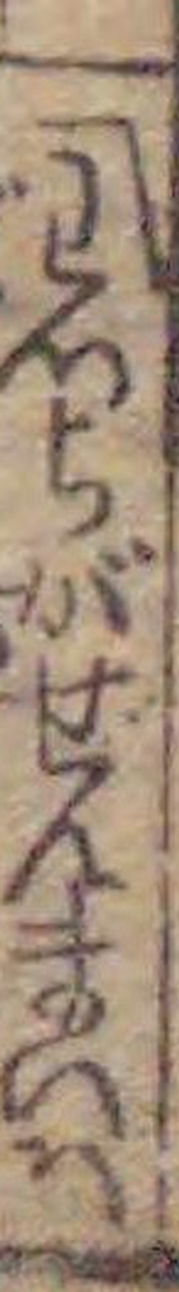〽わつちがせんまいは
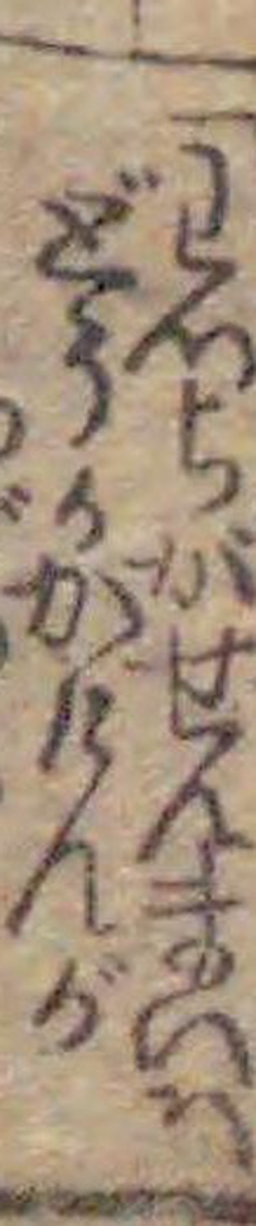どうかかけんが
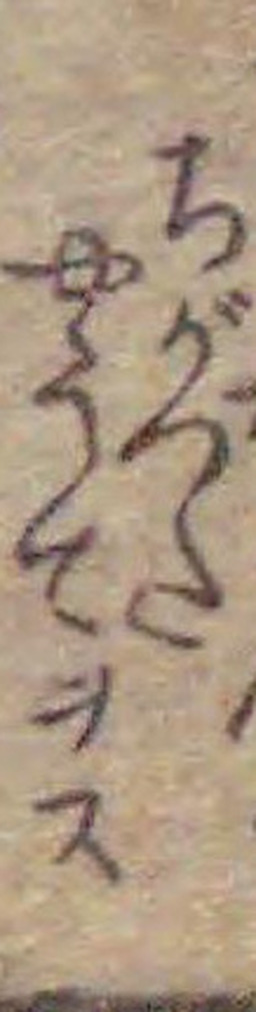やうてヲス
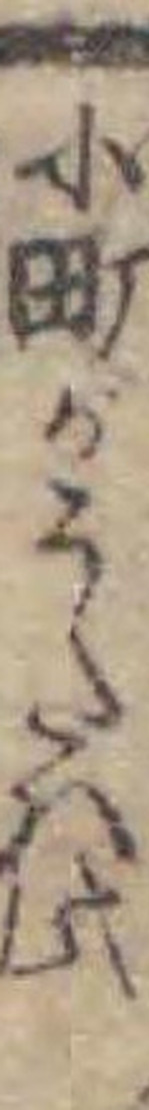小町がうたは此
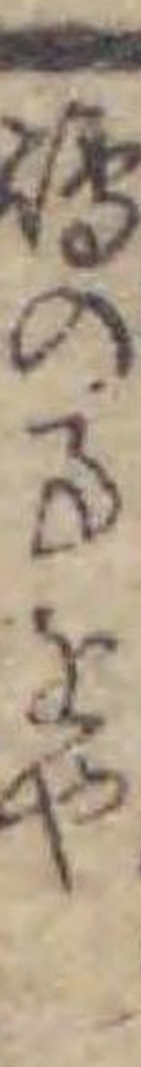島の事をや
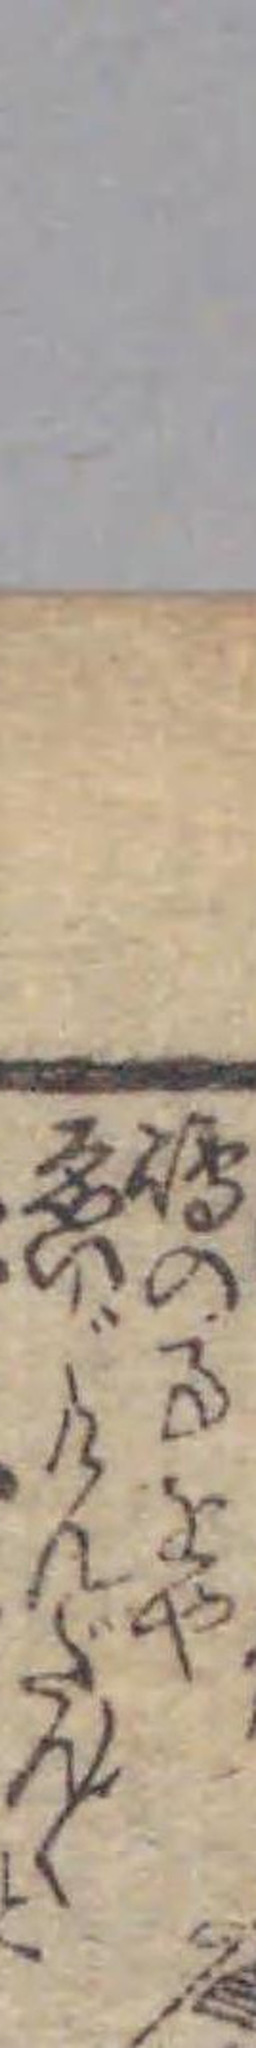ゑいじけんだん〳〵と
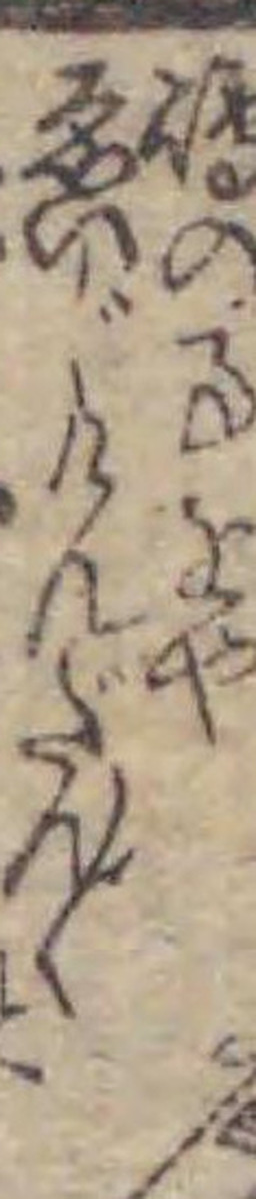ゑいじけんだん〳〵と
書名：奇妙頂礼胎錫杖 : 3巻
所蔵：国立国会図書館 National Diet Library, JAPAN
